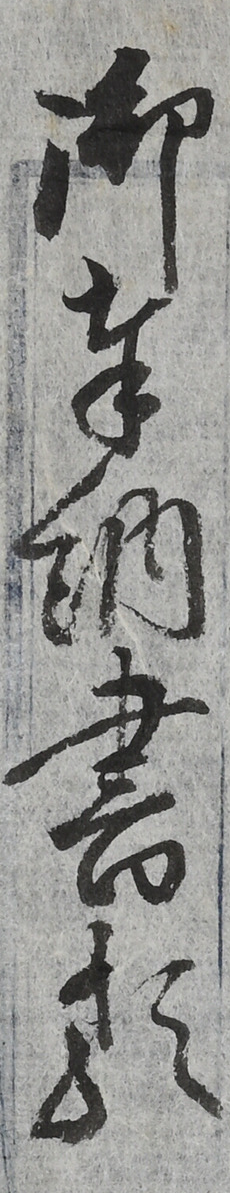御奉納書類

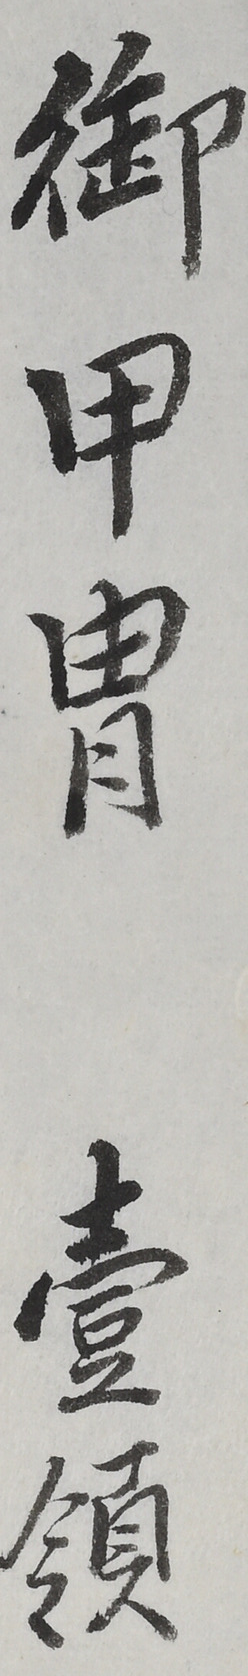御甲冑壱領
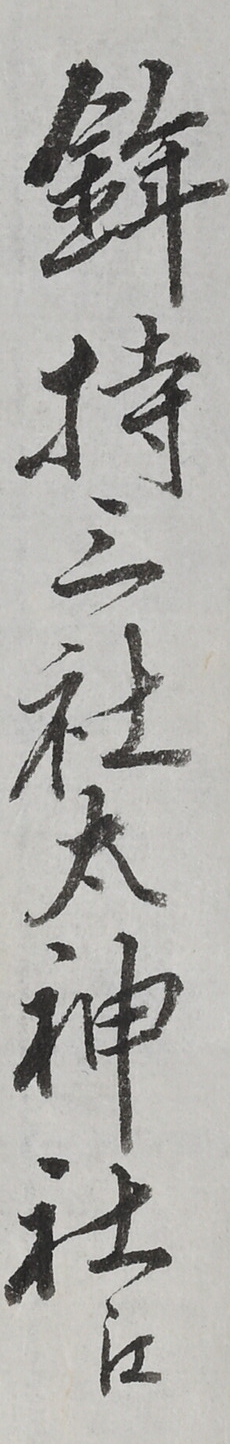鉾持三社太神社江
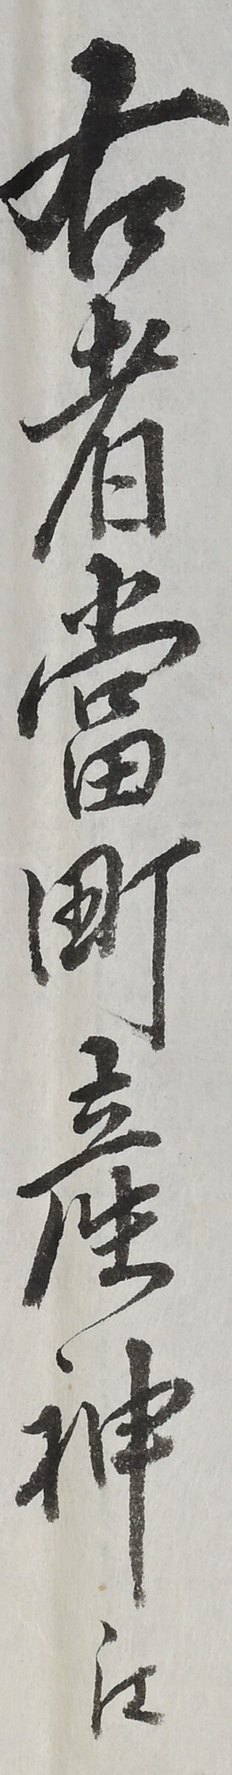右者当町産神江
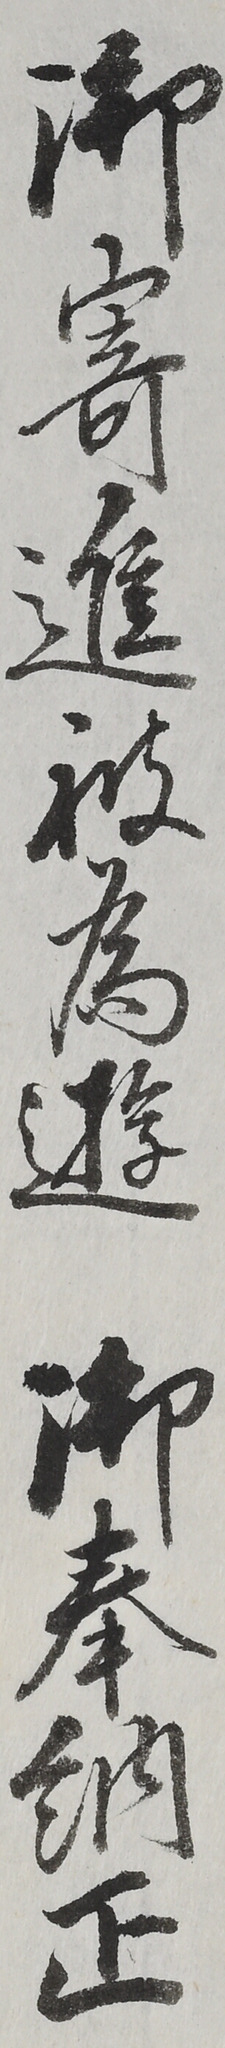御寄進被為遊御奉納正
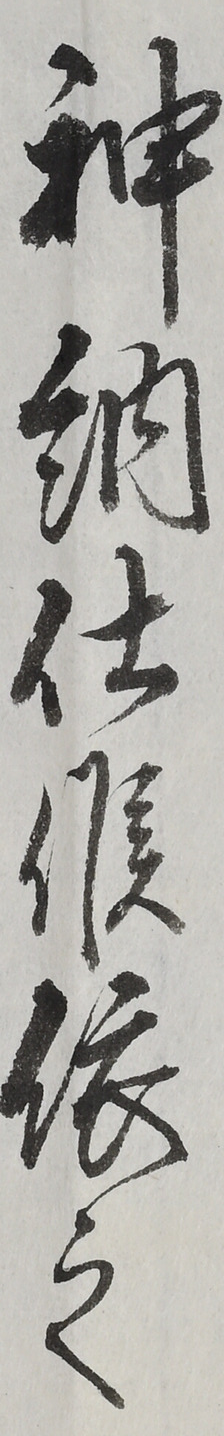神納仕候依之
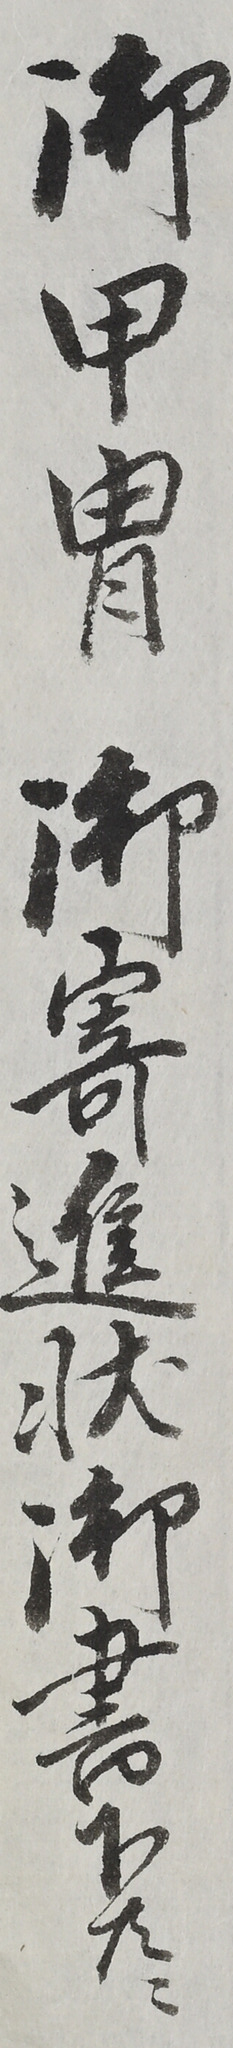御甲冑御寄進状御書下共ニ
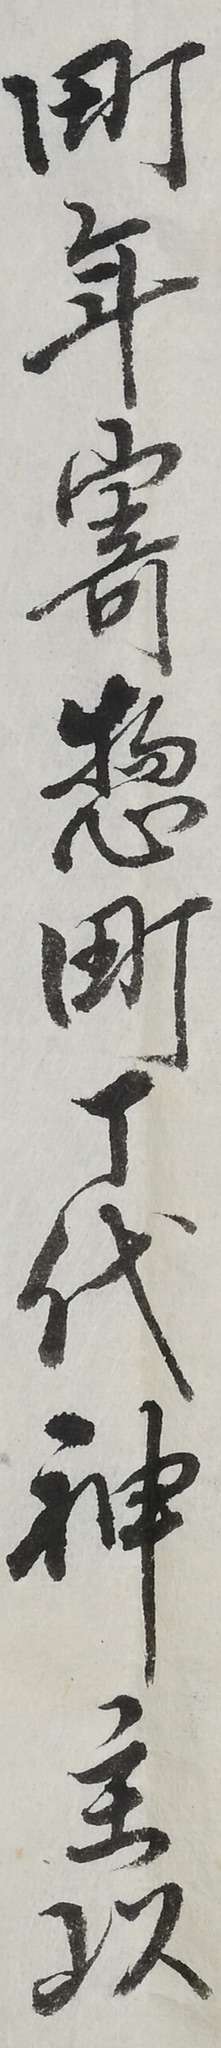町年寄惣町丁代神主以
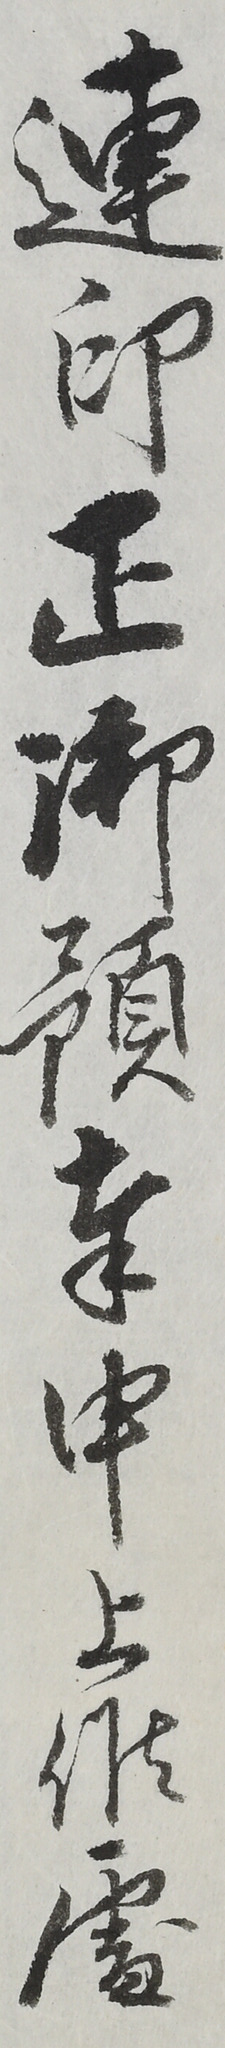連印正御領奉申上候処
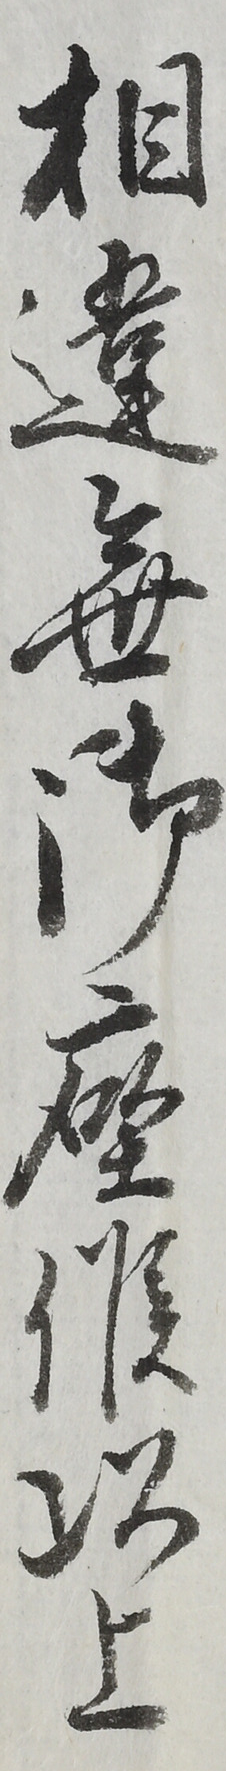相違無御座候以上
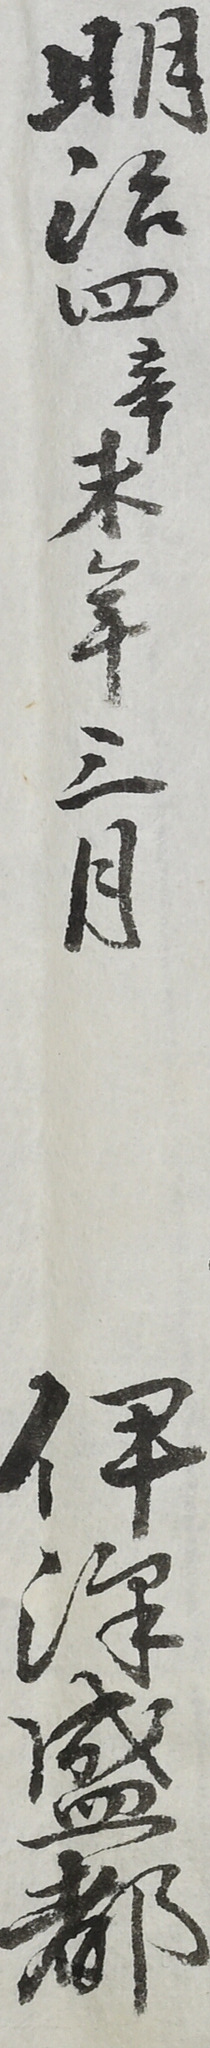明治四辛未年三月伊沢盛都
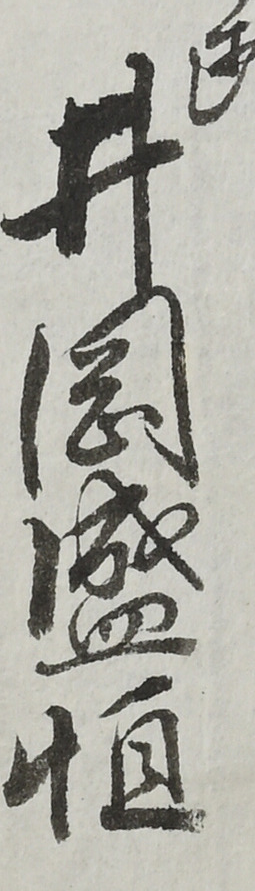井岡盛恒
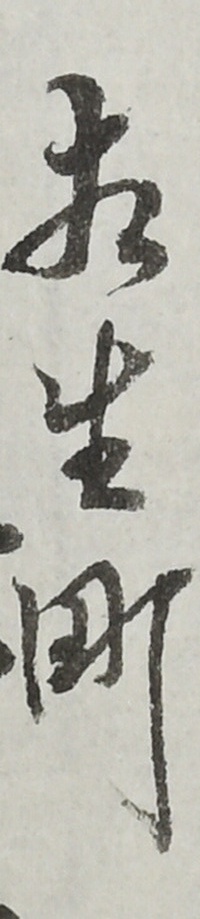相生町
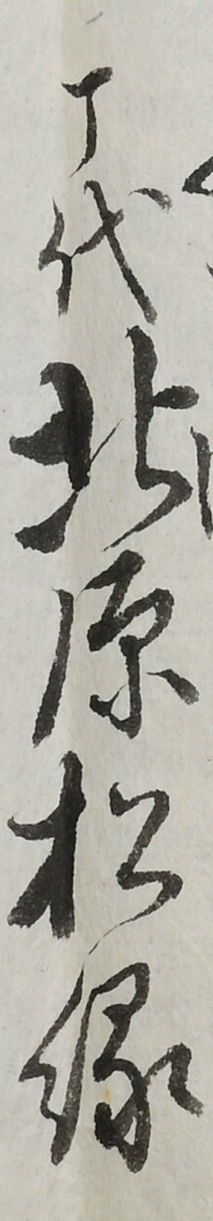丁代北原松縁
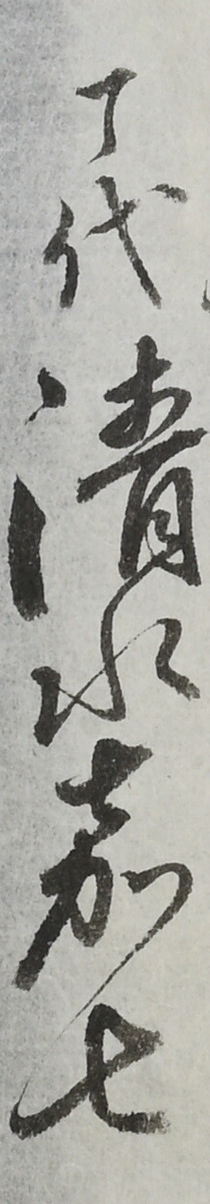丁代清水嘉七
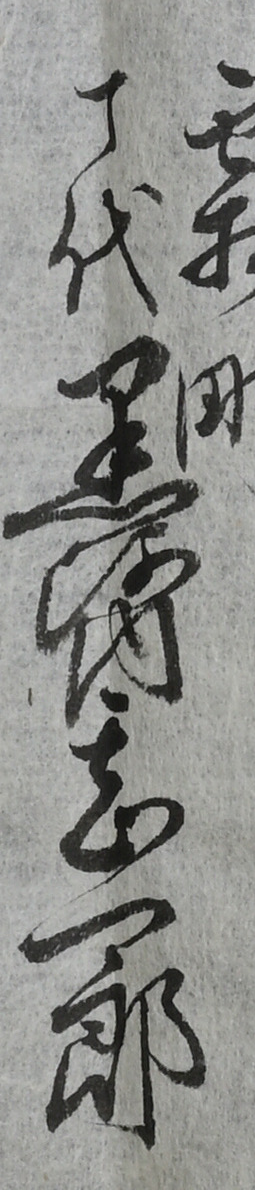丁代黒河内甚一郎
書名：記
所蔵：伊那市立高遠町図書館・合同会社AMANE
